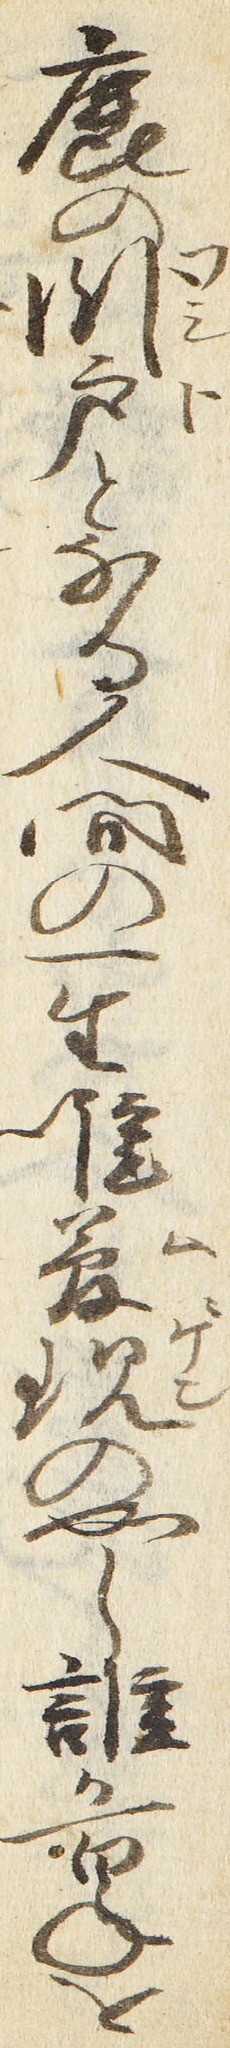鹿の臥戸となる人間の一生唯夢現の如し誰か百年を
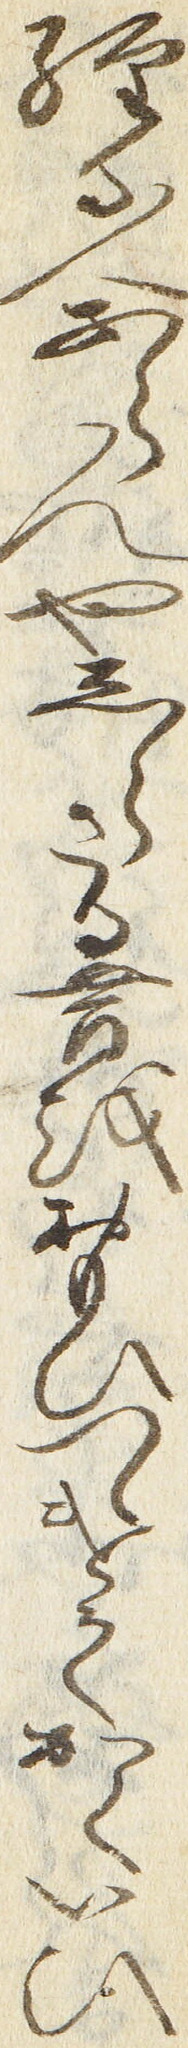経る人あらんやしらさる昔をおもひつゝけてかくいひ
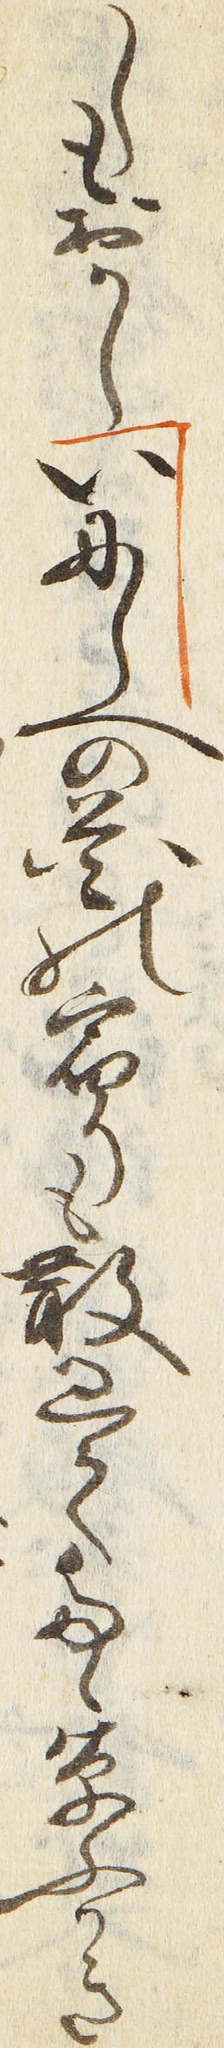しもおかし「いにしへの花の宿りも散過てたた草ふかき
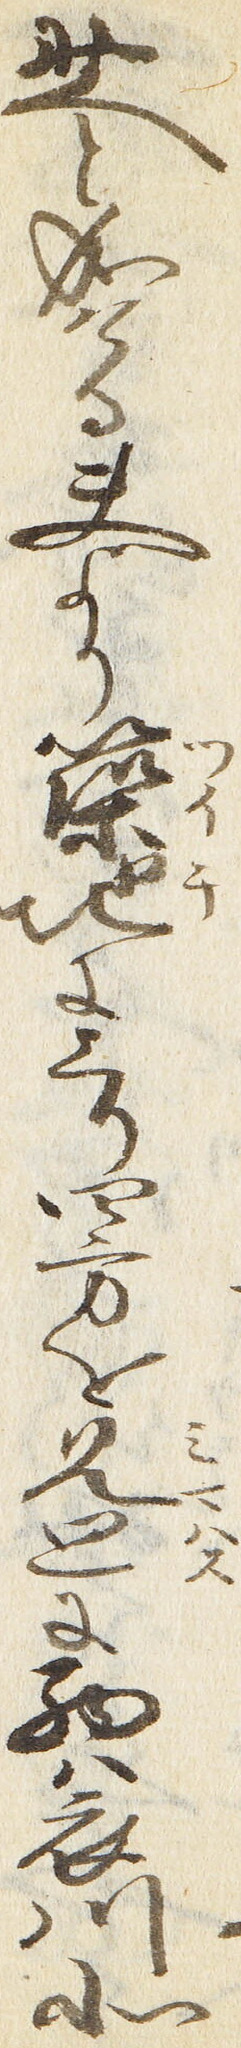野へと成ける夫より築地に上り四方を見廻に西ハ衣川北
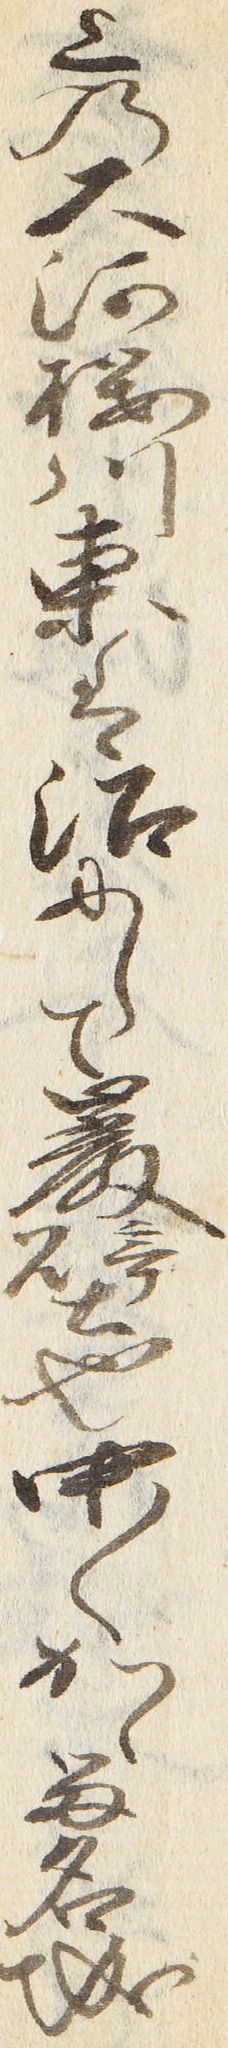上の大河桜川東は沼にして巌壁也中〳〵かかる名城
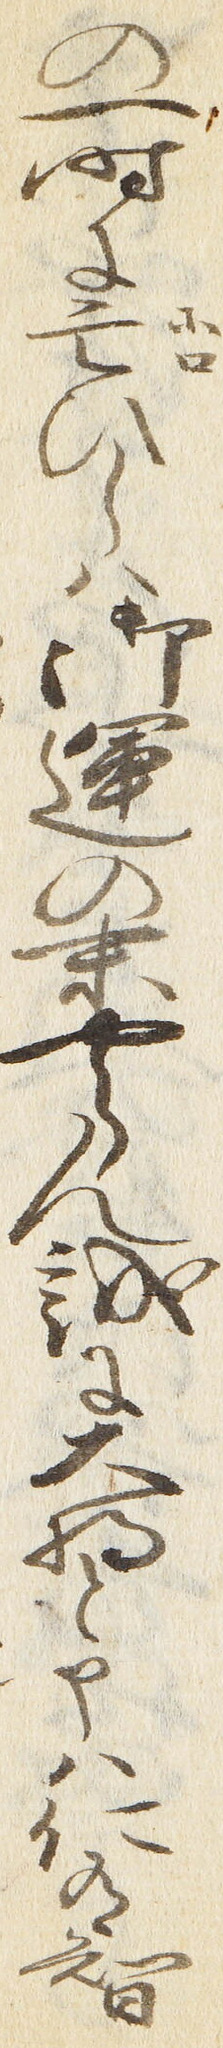の一時に亡ひしは御運の末やらん誠に大将と申は仁有智
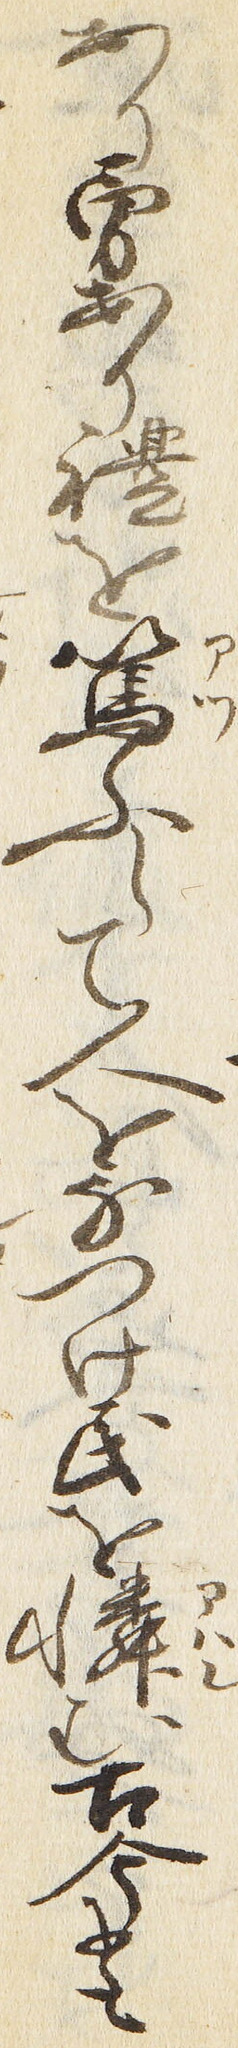あり勇あり礼を篤ふして人をなつけ民を憐む古今にも
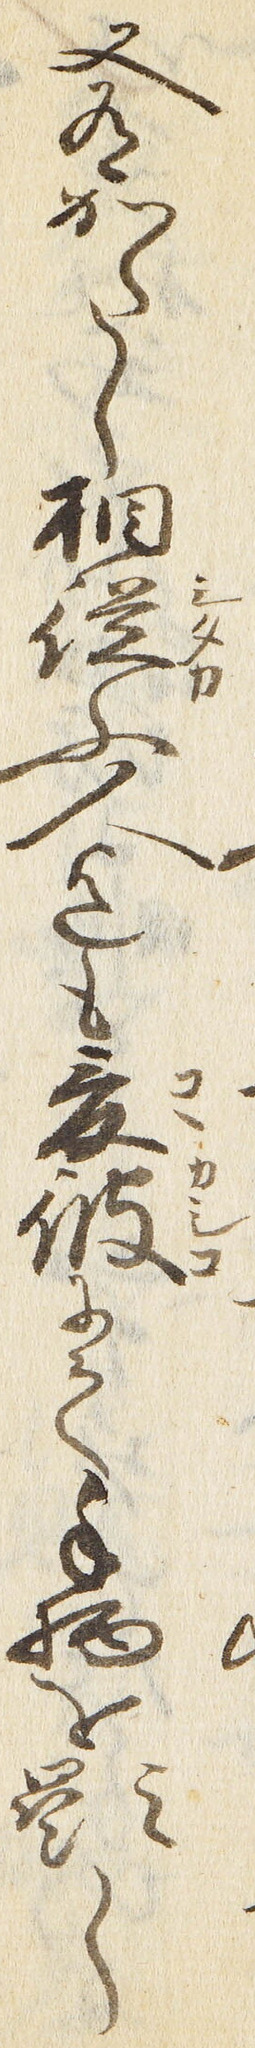又有かたし相従ふ人迄も爰彼にて手柄を顕し
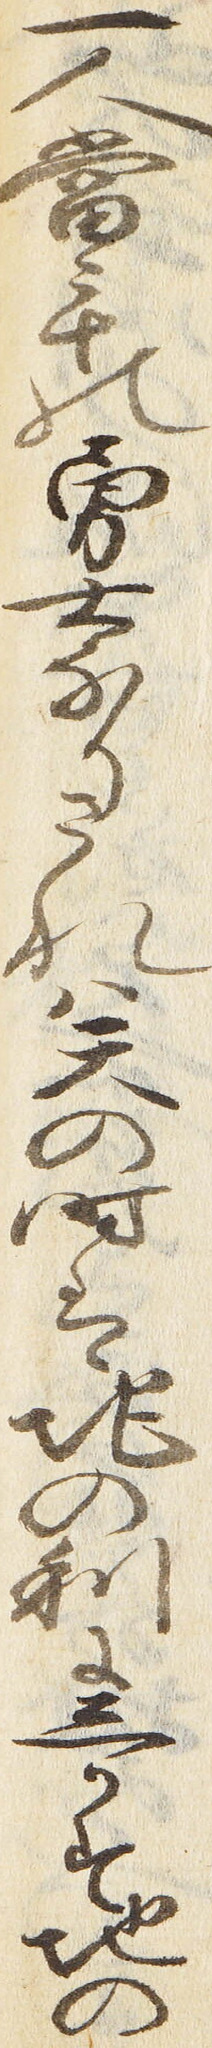一人当千の勇士なりされは天の時は地の利にしかす地の
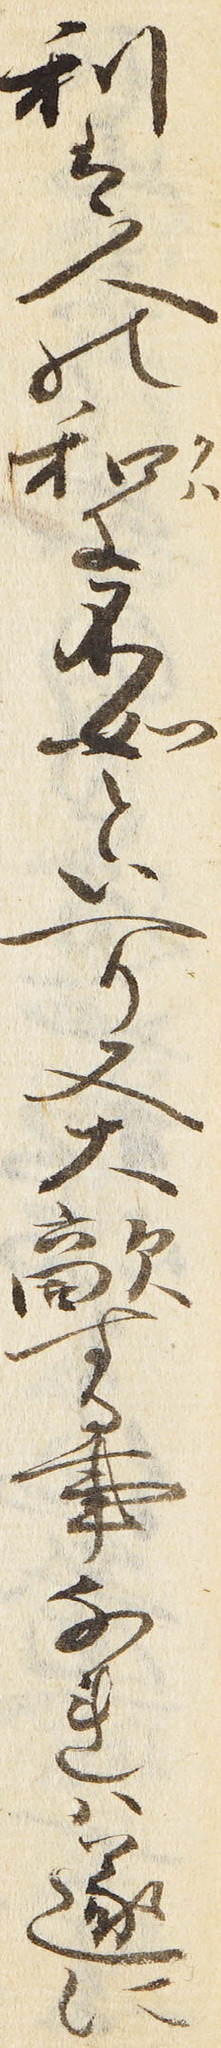利は人の和に不如といへり又大敵する事なれは遂に
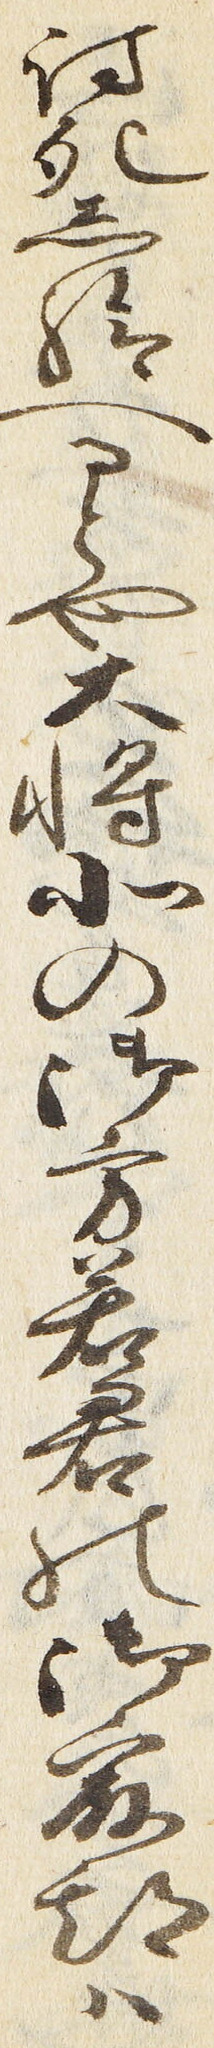討死し給へるとや大将北の御方若君の御最期は
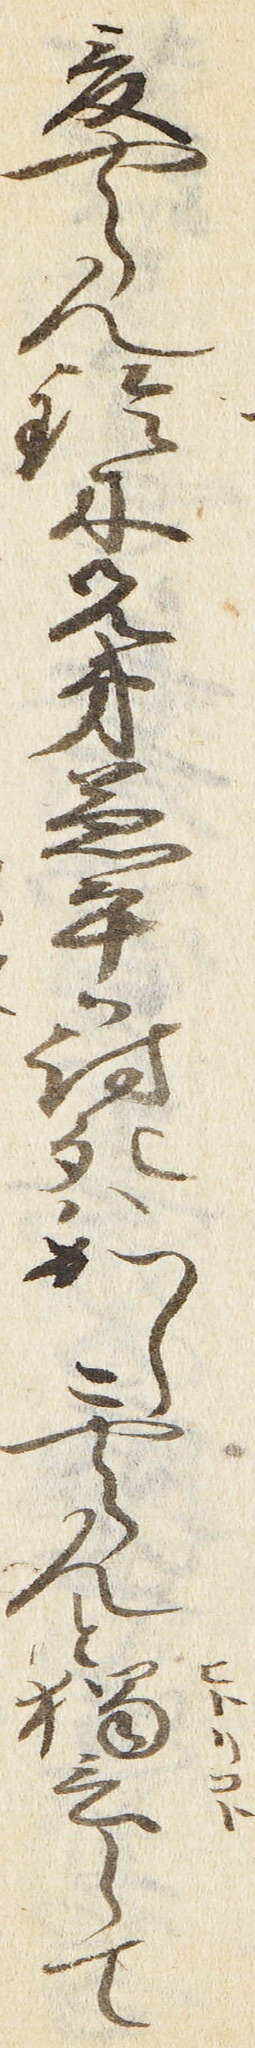爰やらん鈴木兄弟兼平か討死はかしこやらんと独言して
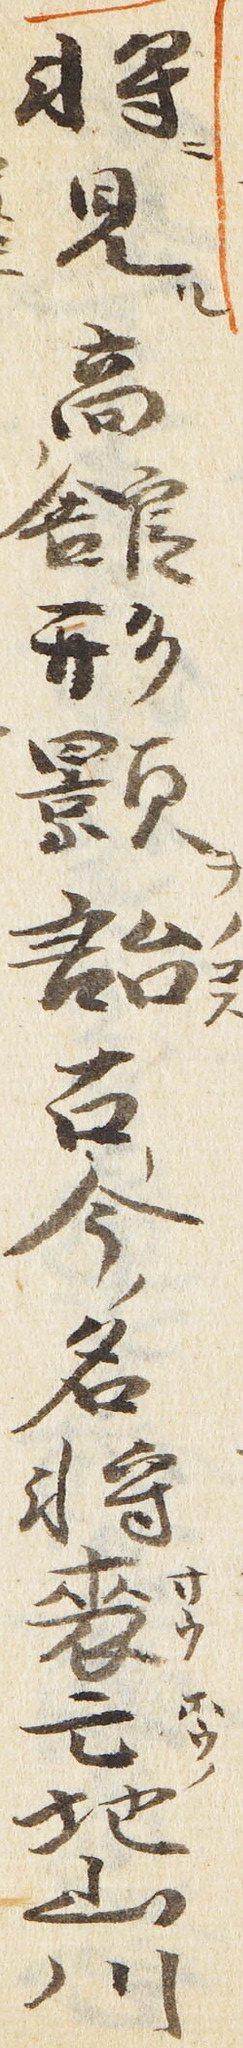「将ニ見ル高舘形影ヲ詒古今ノ名将喪亡ノ地山川
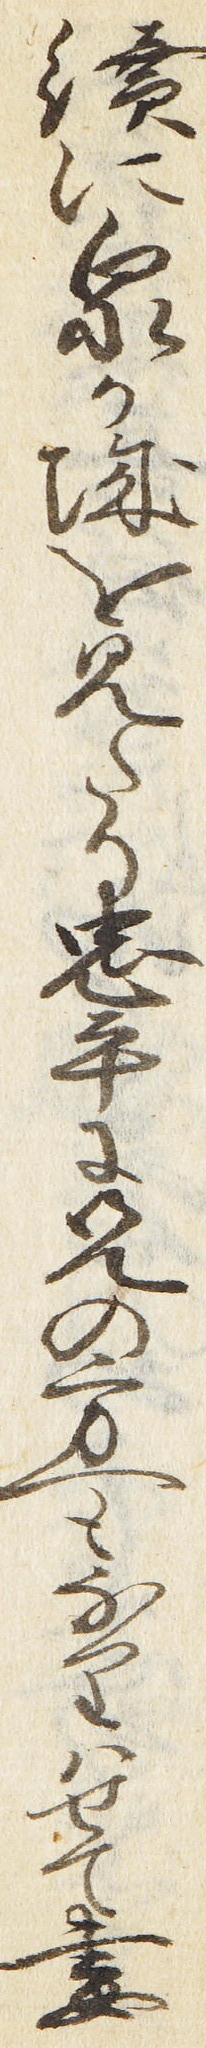続に泉か城を見たり忠平に兄の方へもなりはせて妻
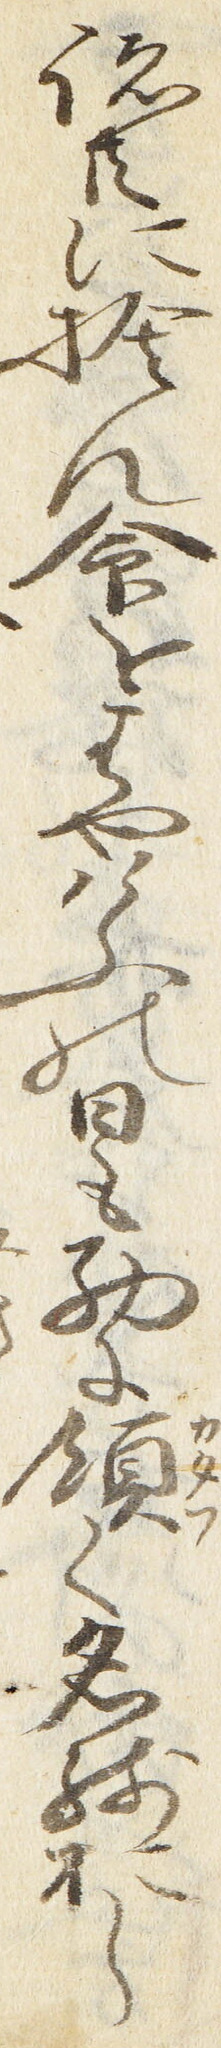諸共に捨ん命をはやけふの日も西に傾く名残おし
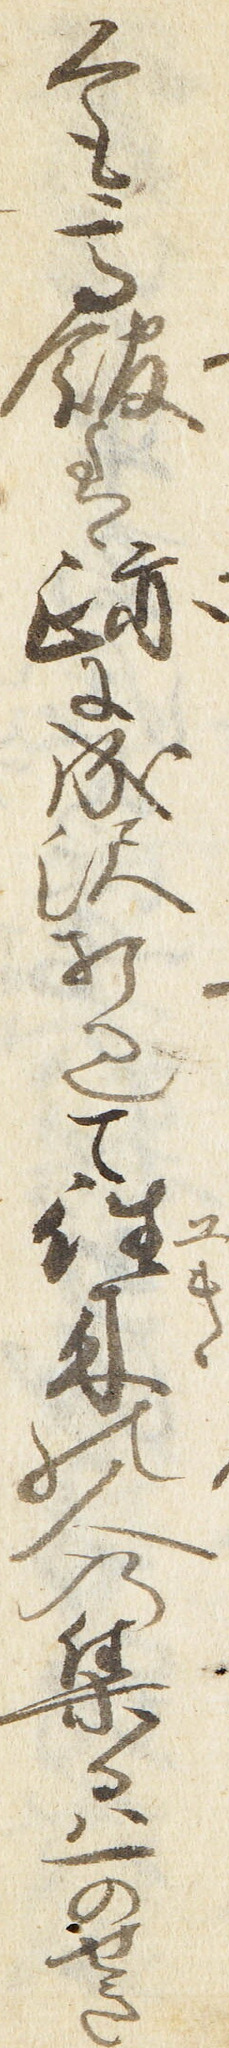くも高館は跡に成沢打過て往来の人の集るは一のせき
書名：海陸世話日記
